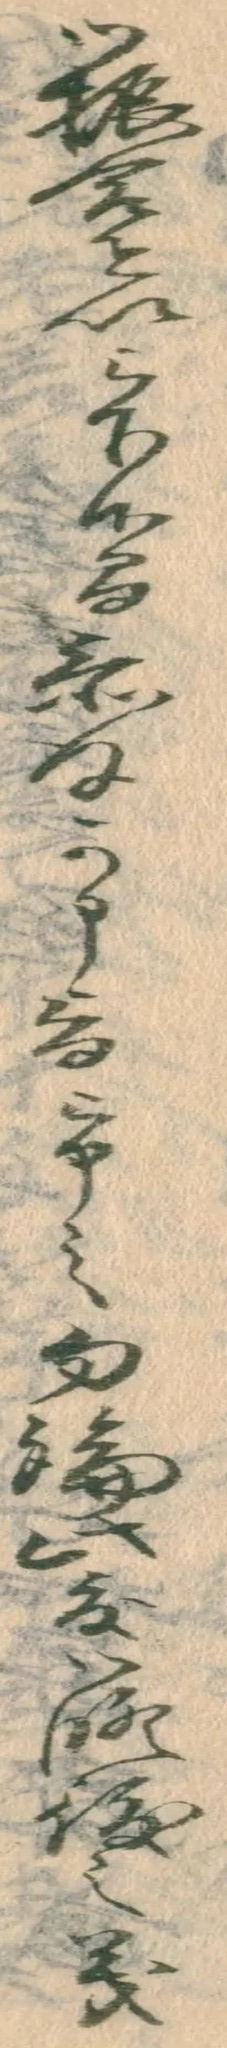御振合を以被下候間忝存可申旨被申之勿論此度御修復之義
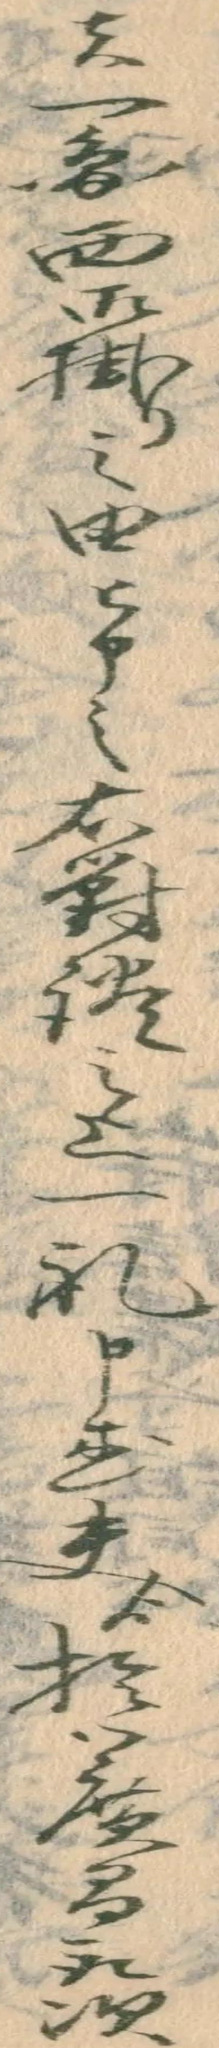は一円西御掛り之由被申之右対談之上一礼申述夫ゟ於御広間取次
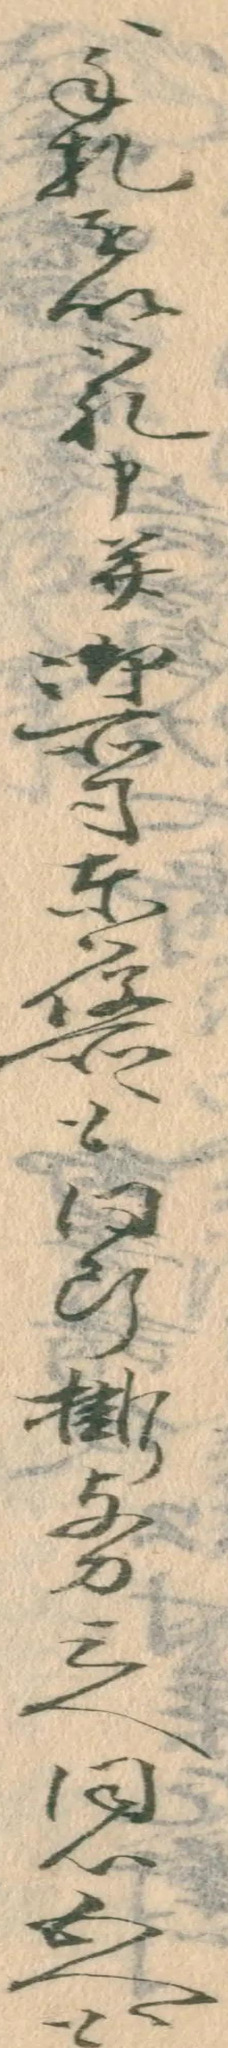へ手札を以御礼申并御所司東御役所へも同断掛り与力三人同心五人へも
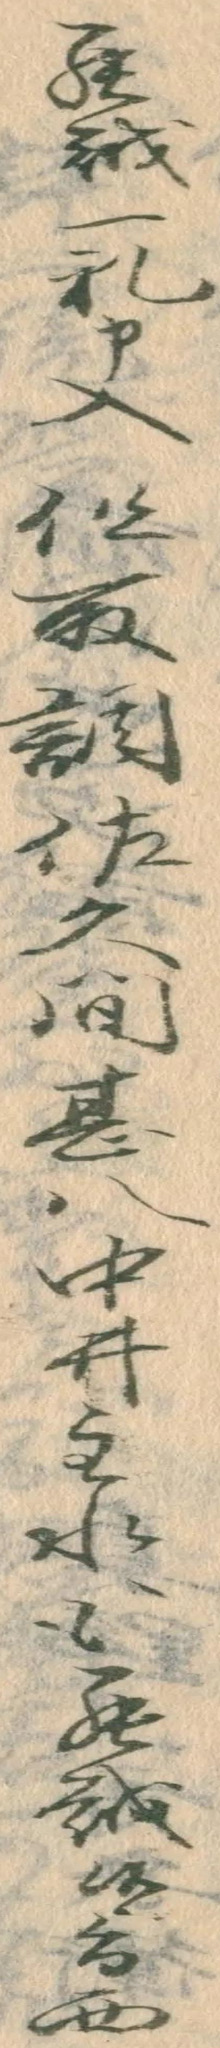罷越一礼申入但取調佐久間甚八中井主水へも罷越候旨西
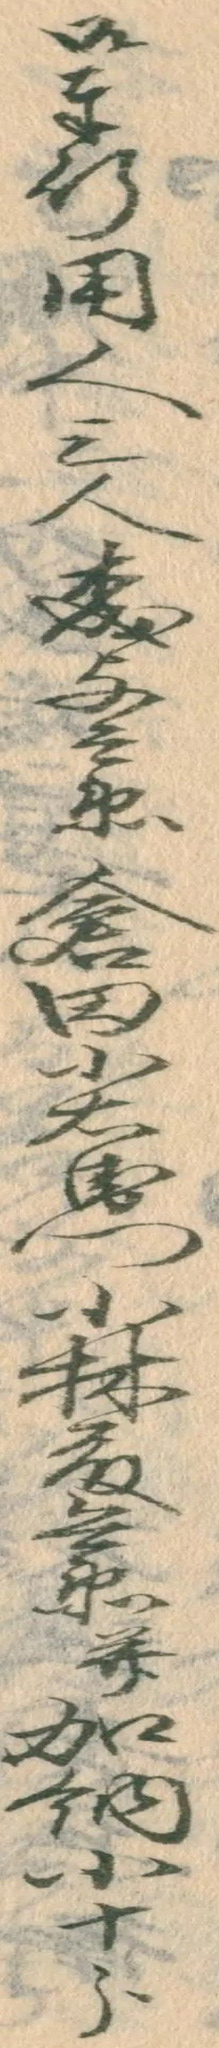御奉行用人三人森与兵衛倉田小右衛門小林藤兵衛并加納小十郎
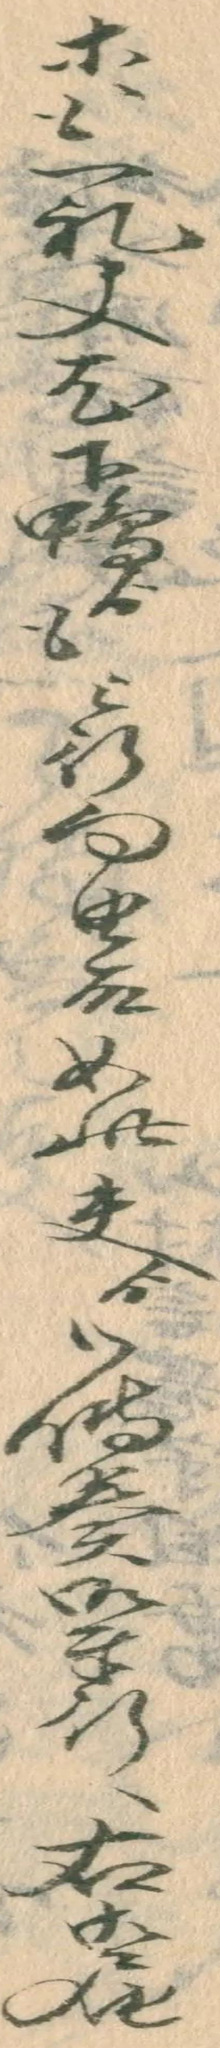等へも一礼申入尤下鴨ゟも被行向由故如此夫ゟ御伝奏御奉行へ右御届
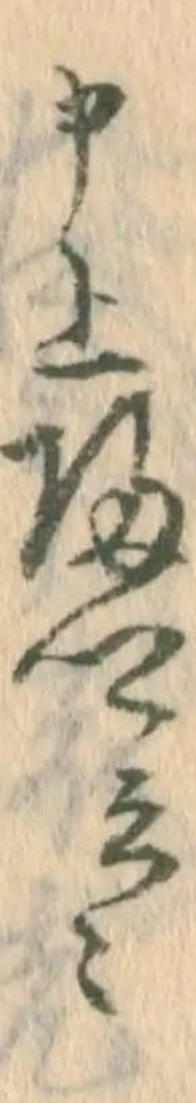申上帰郷云々
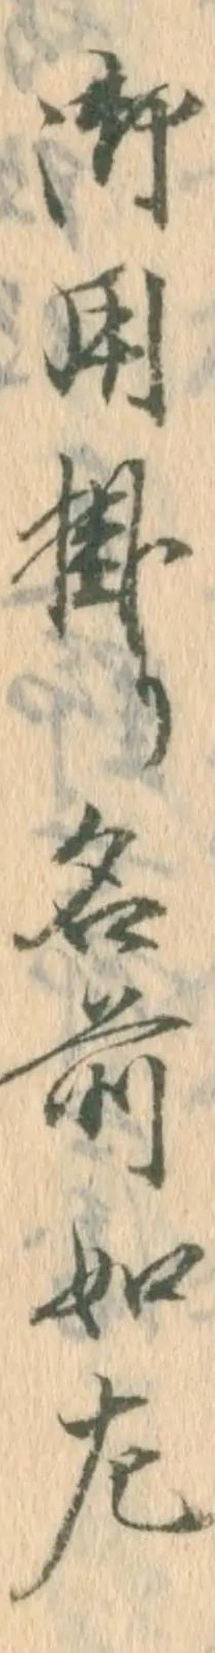御用掛り名前如左

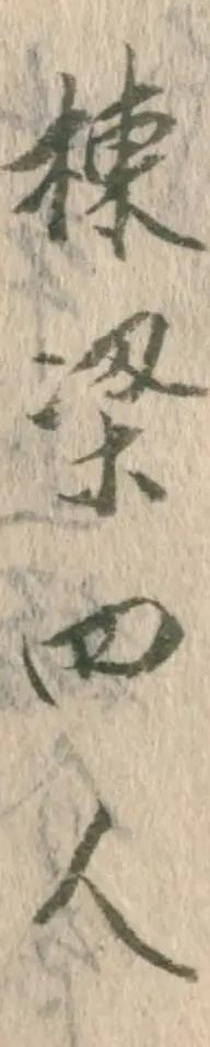棟梁四人
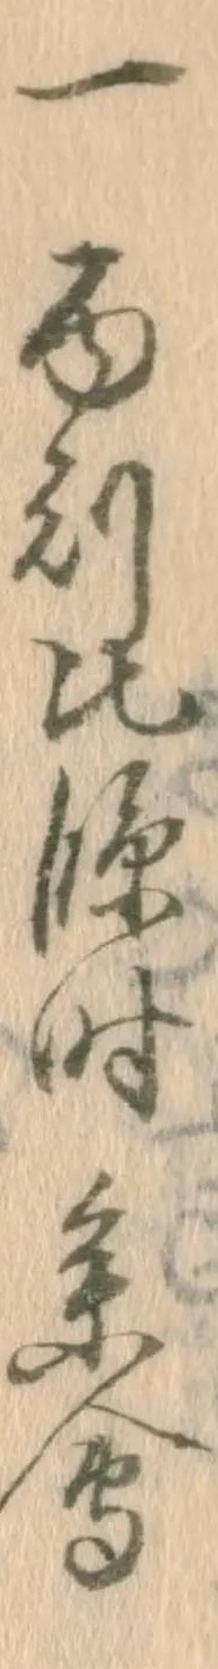一酉刻比臨時参会
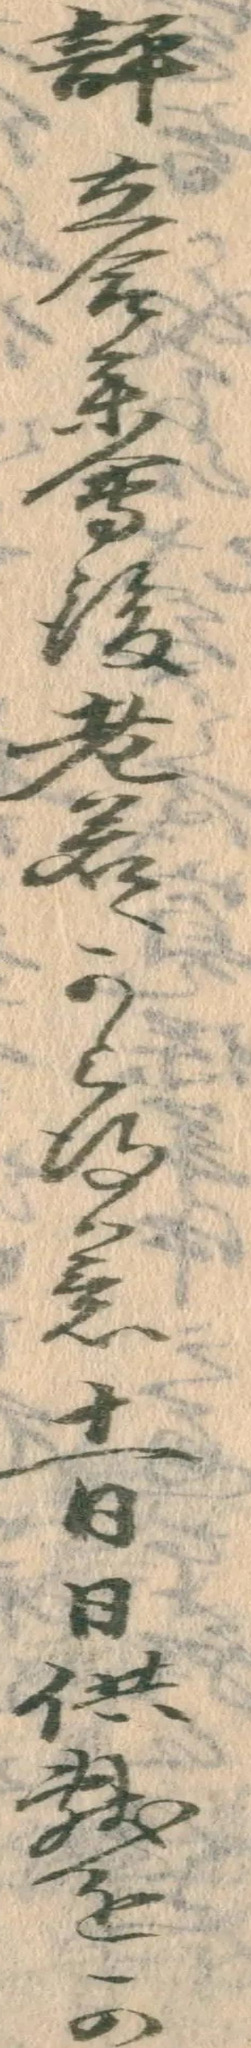評立合参会後老若へ可被得御意十一日日供献進可
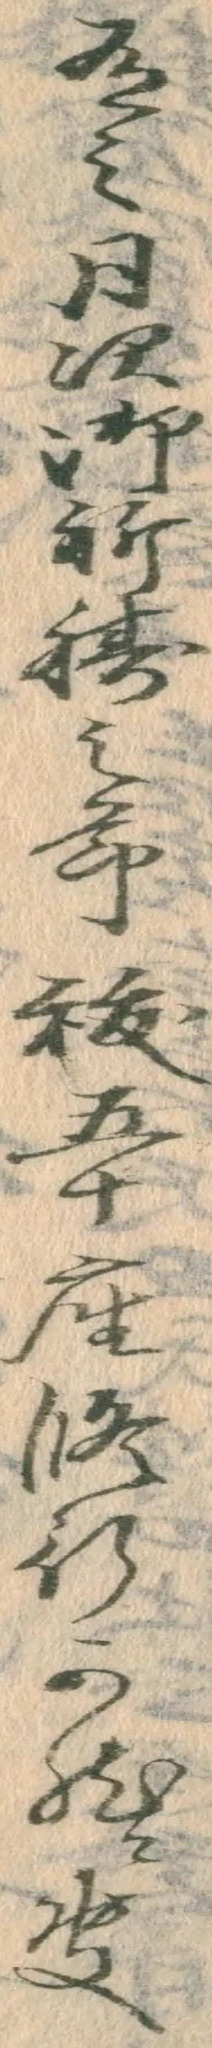有之月次御祈祷之節祓五十座修行可然ニ決
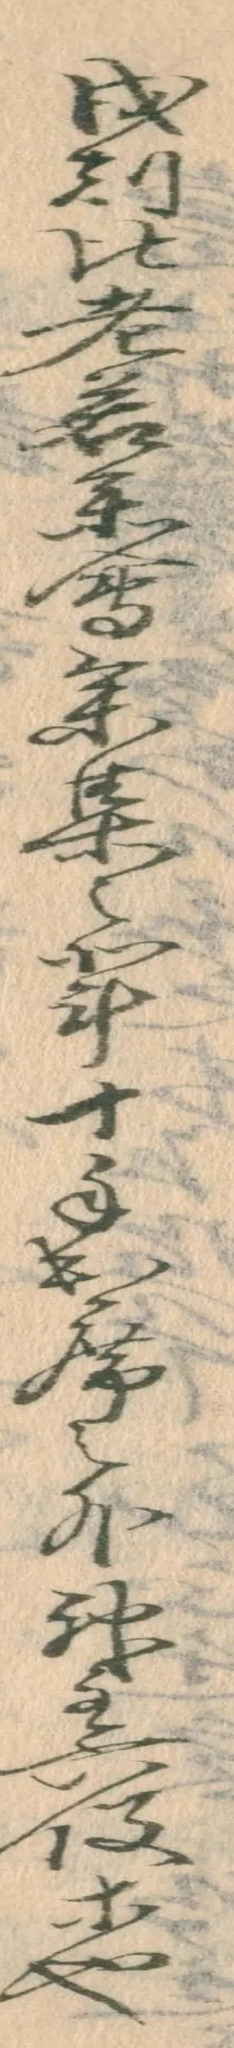一戌刻比老若参会参集之輩十手出席之外神主六役等也
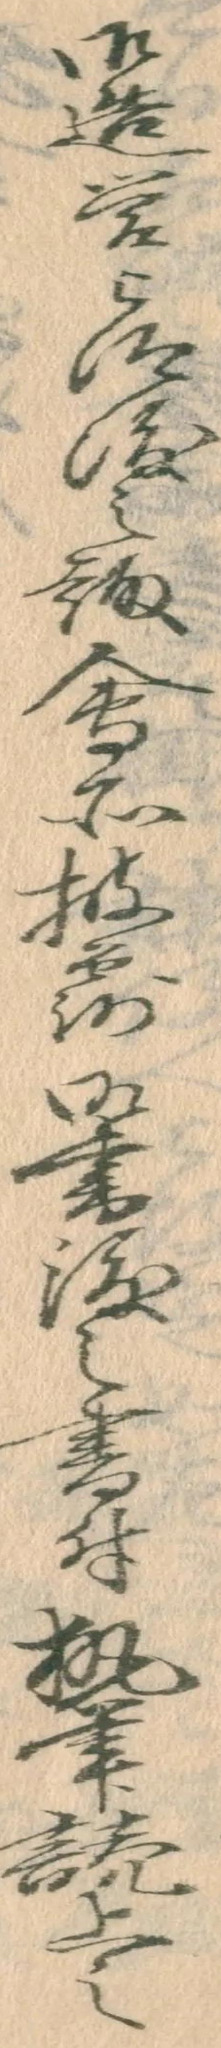御造営被仰渡之趣会所披露御書渡之書付執筆読上之
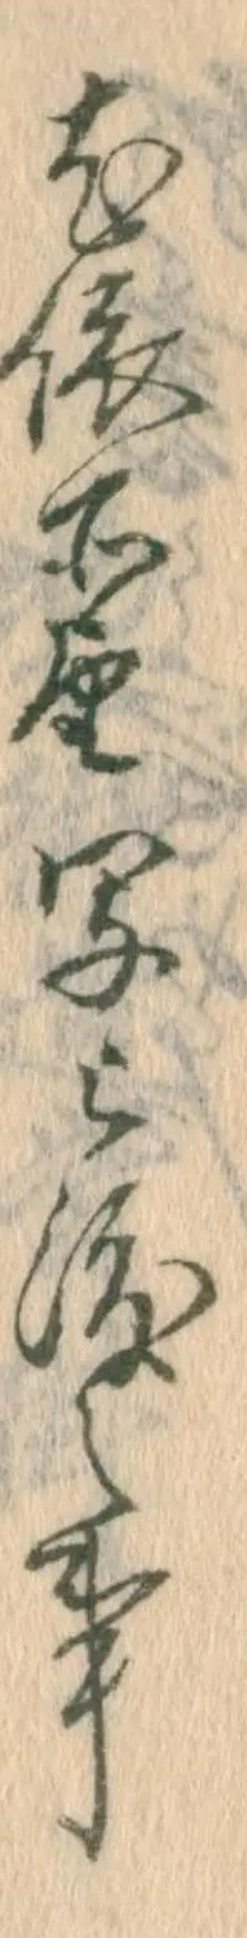尤依所望写被渡之事
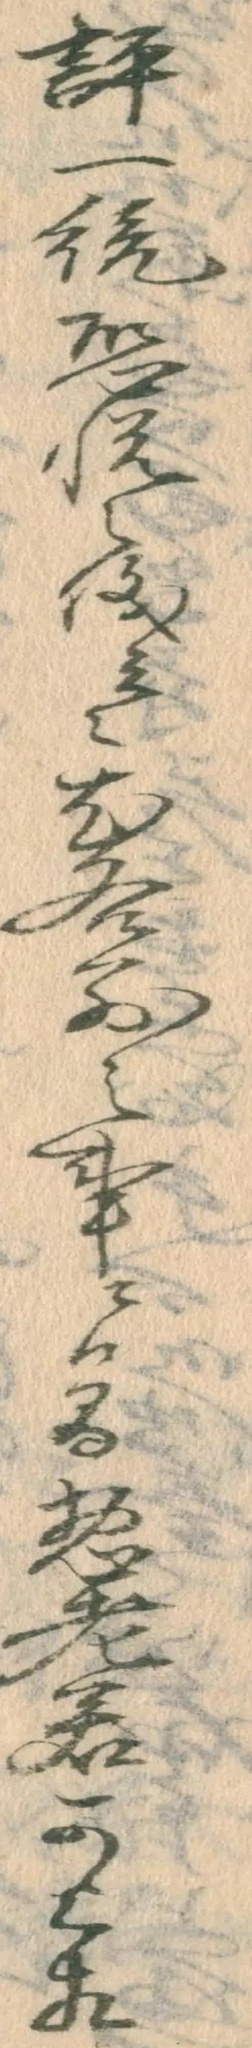評一統恐悦之儀云々尤各別之事ニ候間惣老若可被相
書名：賀茂社記録. 第17冊
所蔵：国立国会図書館 National Diet Library, JAPAN
